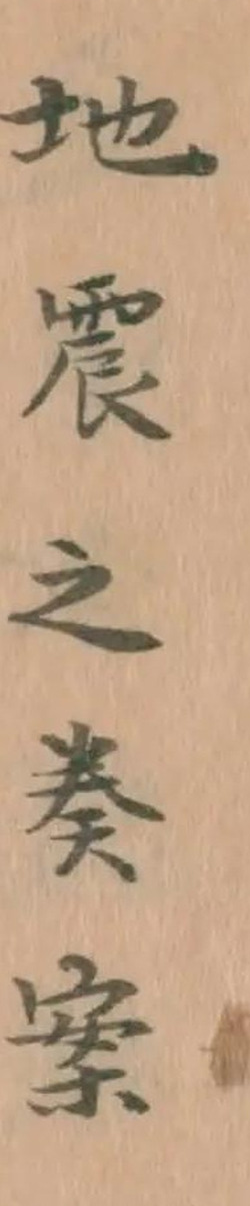地震之奏案
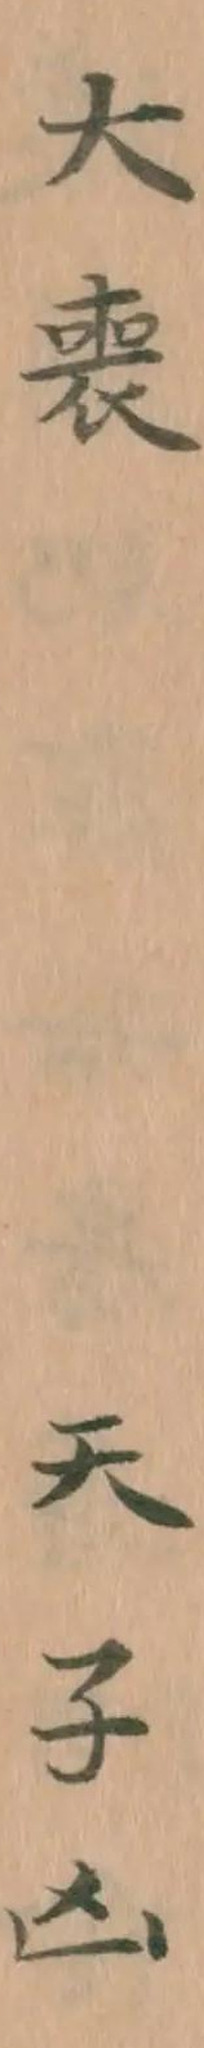大喪天子凶
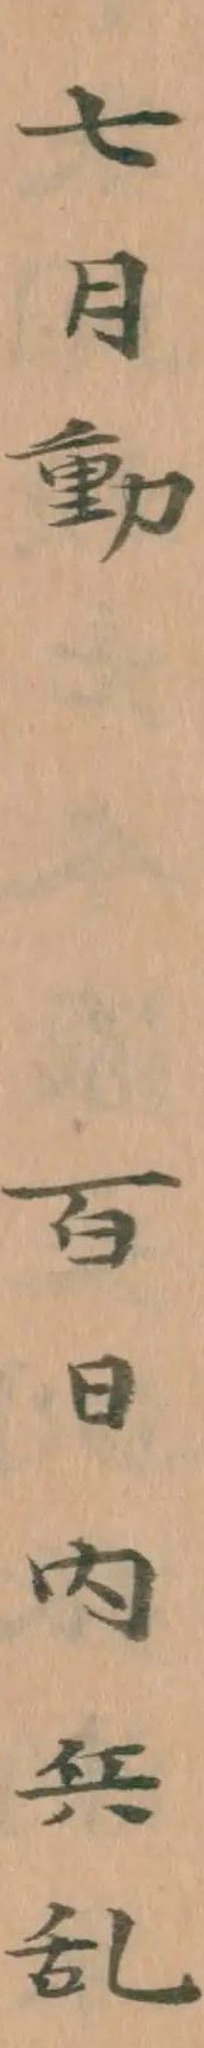七月動百日内兵乱
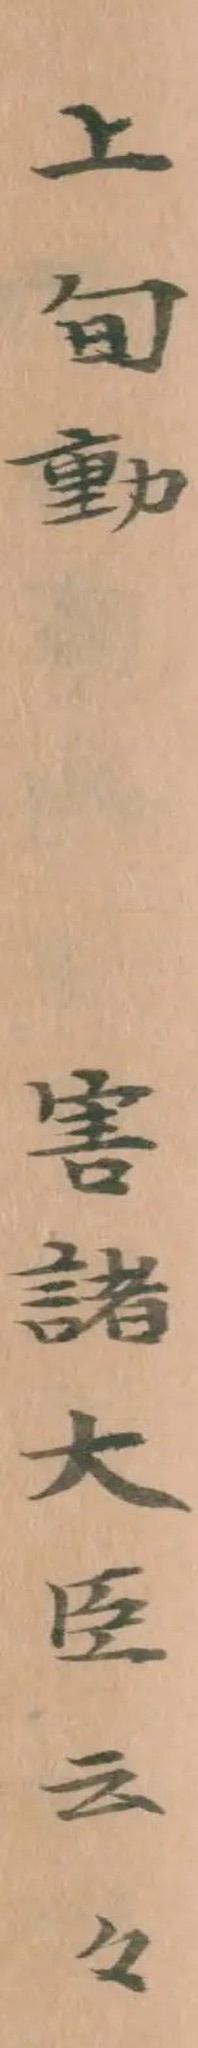上旬動害諸大臣云々
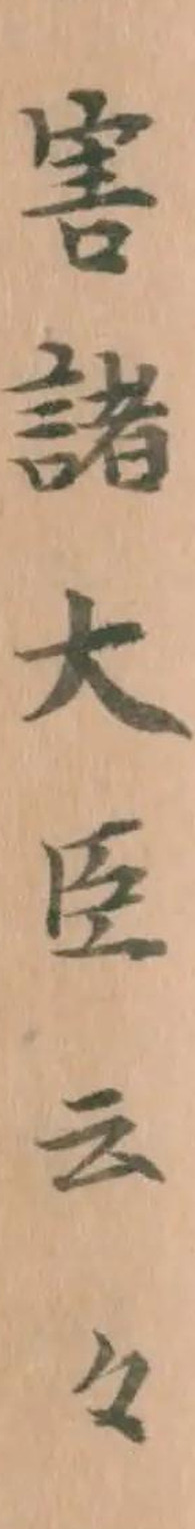上旬動害諸大臣云々
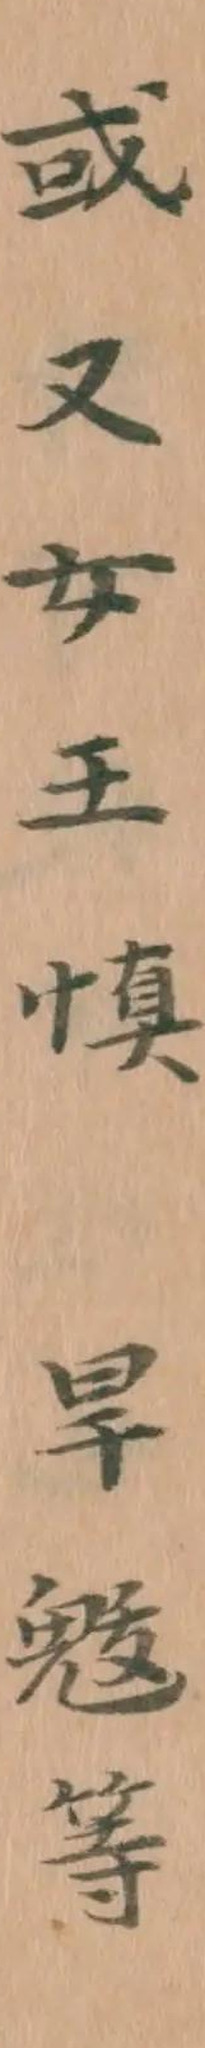或又女王慎旱魃等
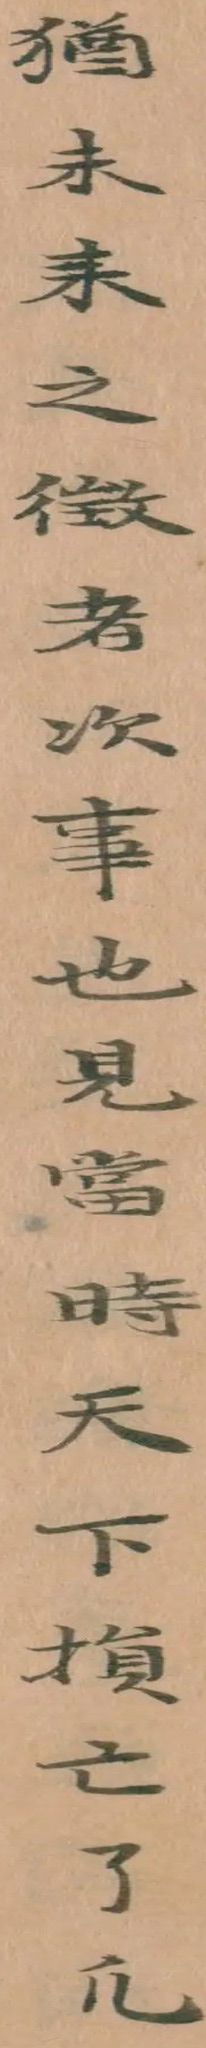猶未来之徴者次事也見当時天下損亡了凡
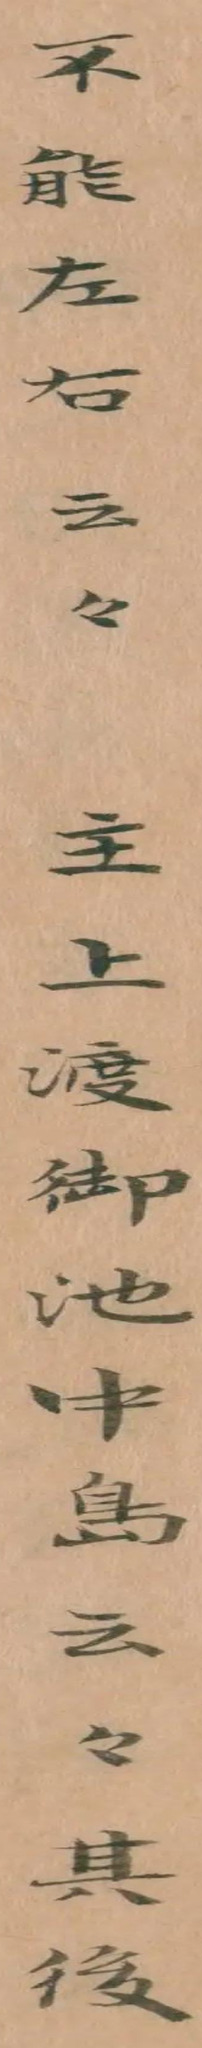不能左右云々主上渡御池中島云々其後
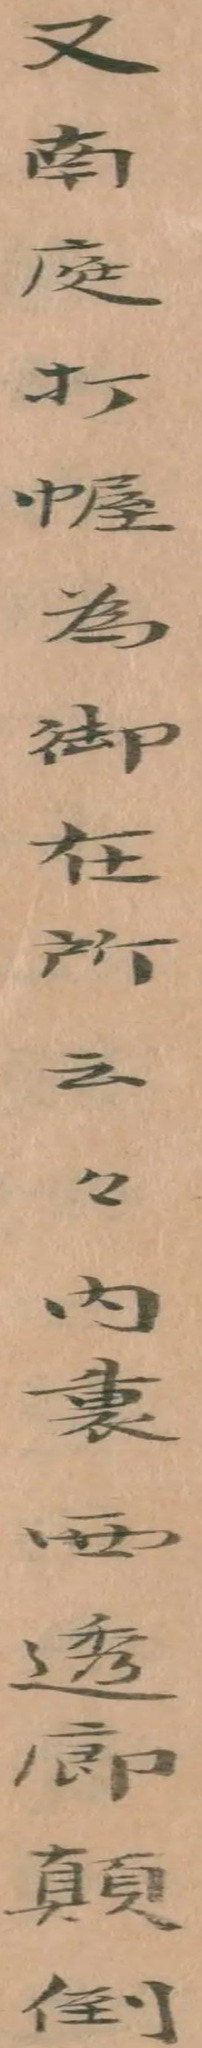又南庭打幄為御在所云々内裏西透廊顛倒
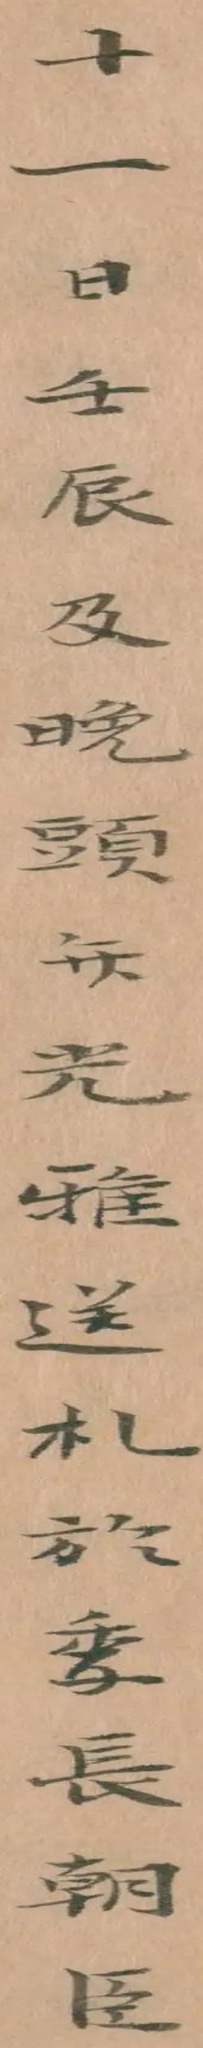十一月壬辰及晩頭弁光雅送札於季長朝臣
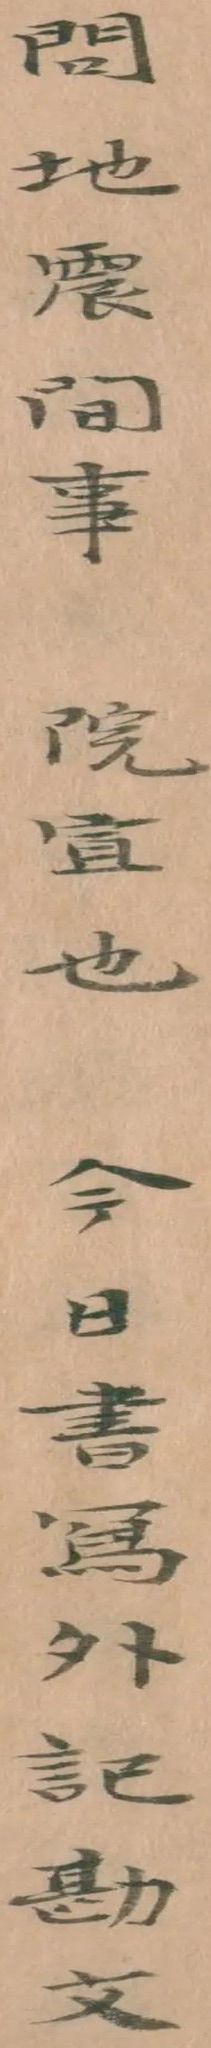問地震間事院宣也今日書写外記勘文
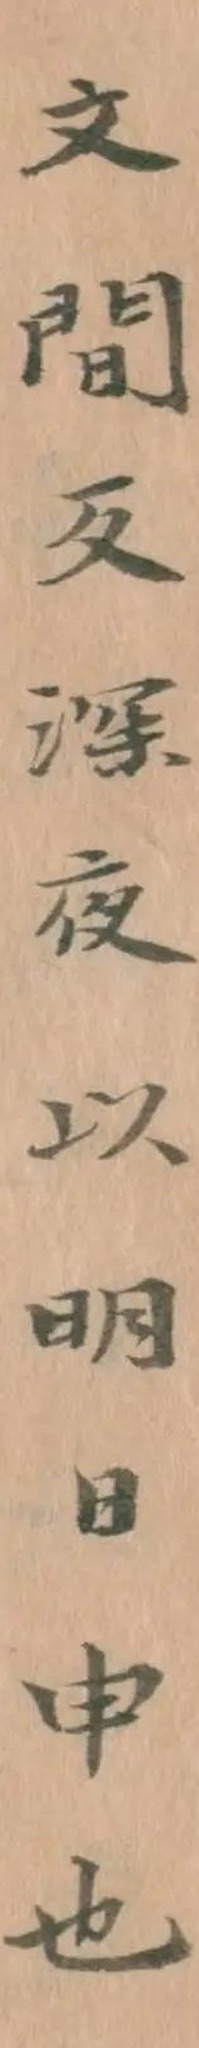文間反深夜以明日申也
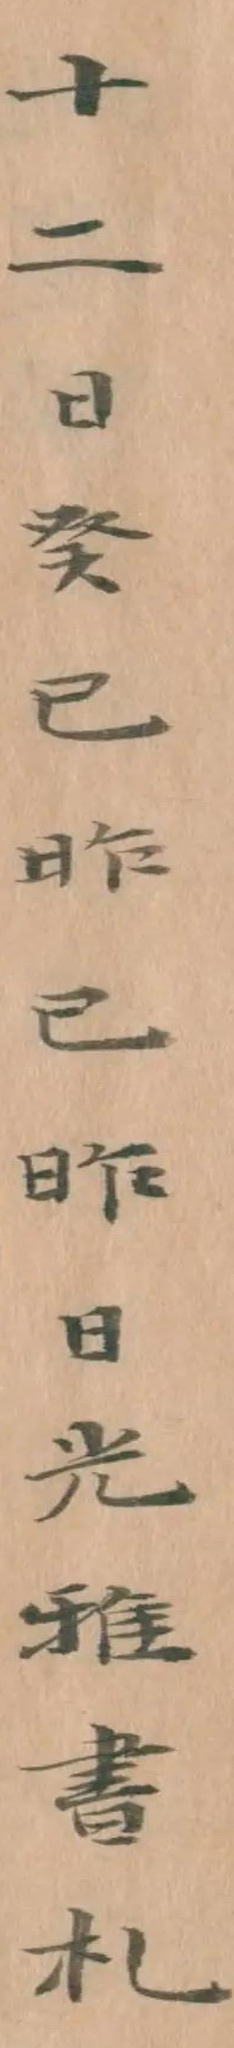十二日癸巳昨已昨日光雅書札

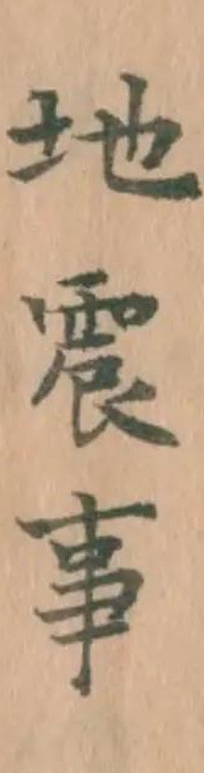地震事
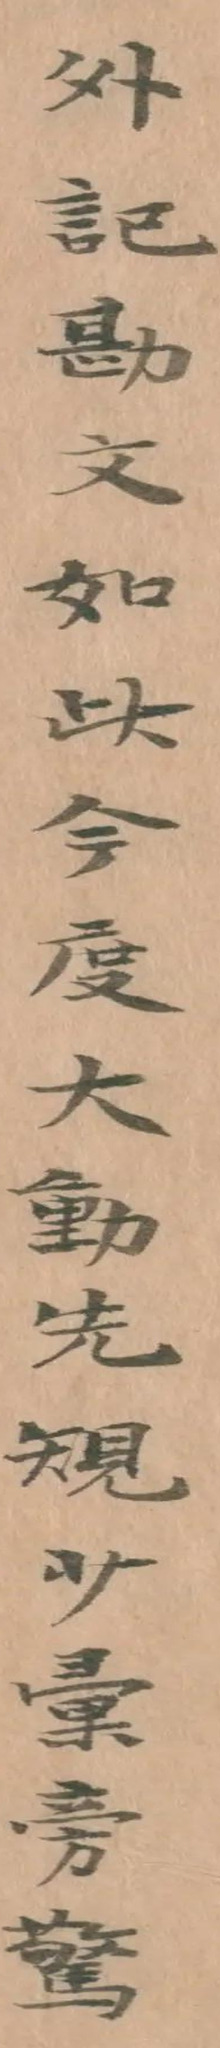外記勘文如此今度大動先規少彙旁驚
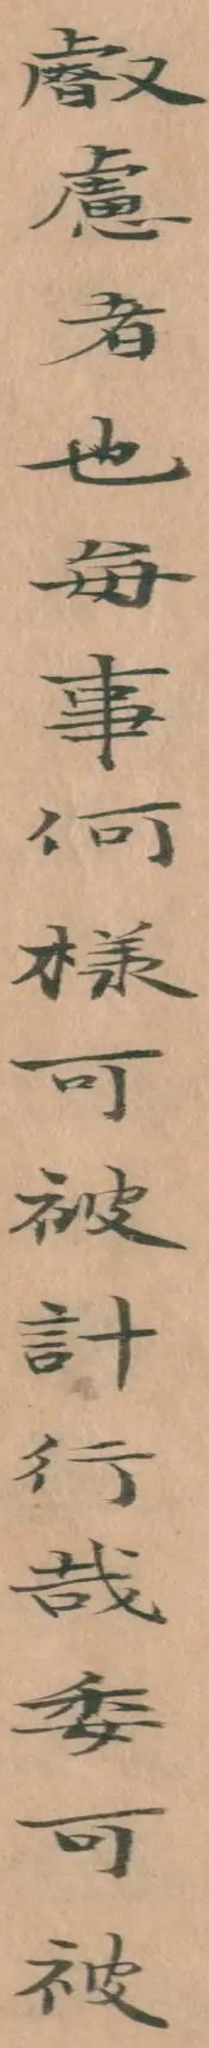叡慮者也毎事何様可被計行哉委可被
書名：地災撮要. 巻5-6(地震之部)
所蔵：国立国会図書館 National Diet Library, JAPAN
